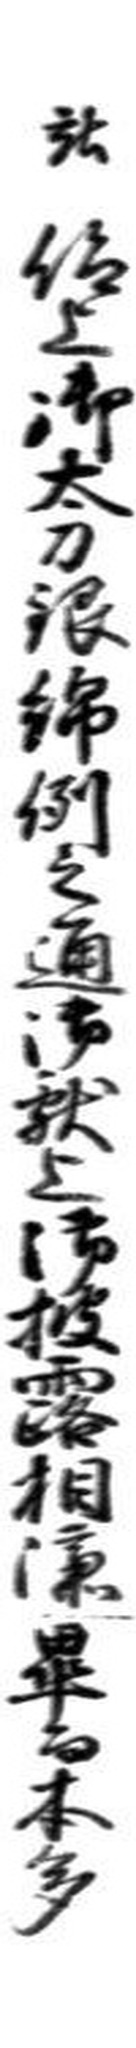被仰上御太刀銀綿例之通御献上御披露相済畢而本多
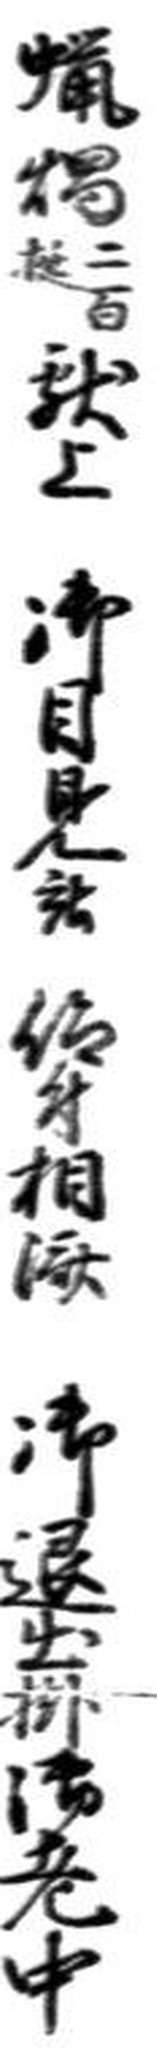蠟燭二百挺献上御目見被仰付相済御退出掛御老中
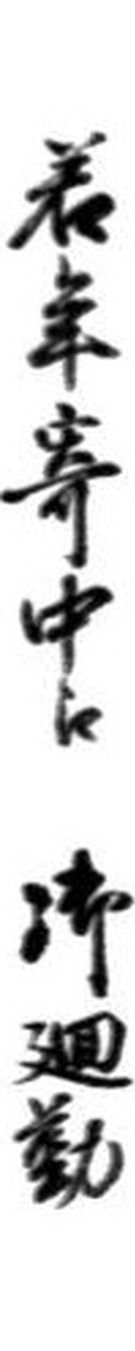若年寄中江御廻勤
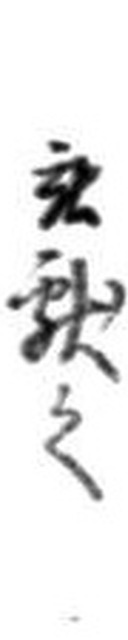被献之
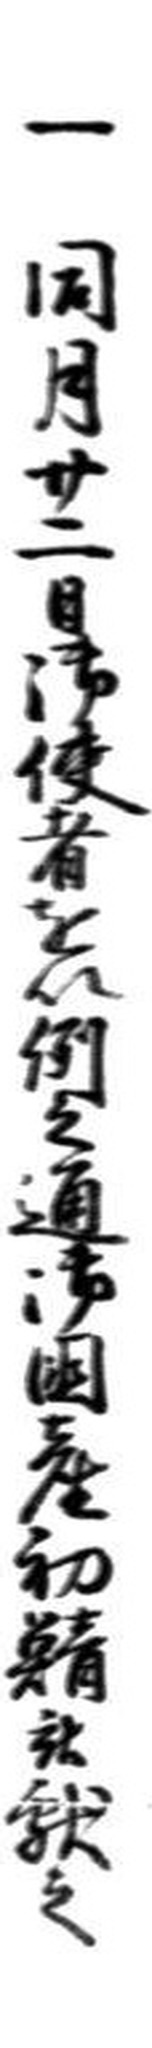一同月廿二日御使者を以例之通御国産初鯖被献之
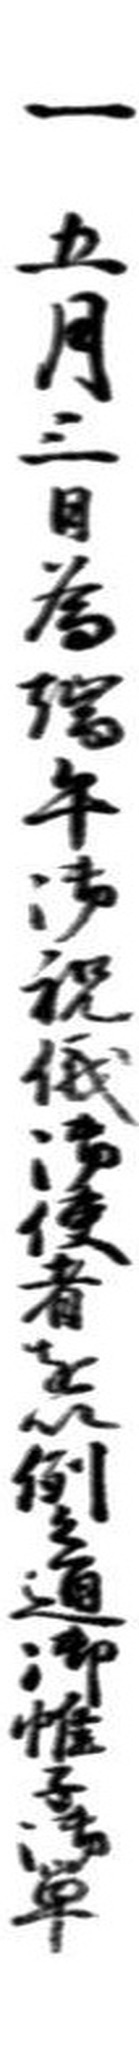一五月三日為端午御祝儀御使者を以例之通御帷子御単

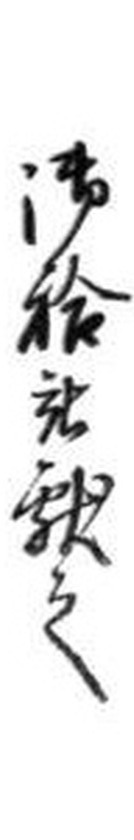御袷被献之
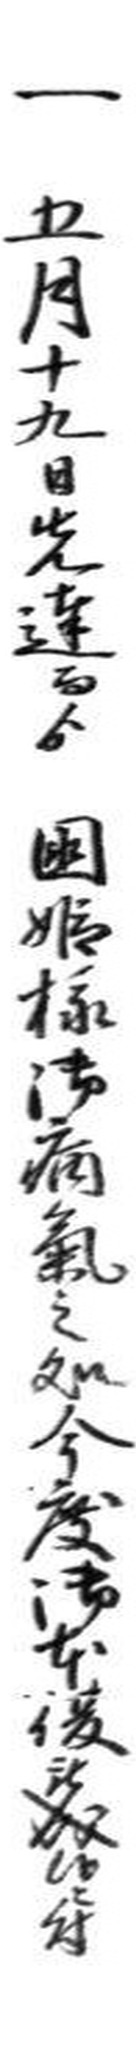一五月十九日先達而ゟ国姫様御病気之処今度御本復被成候ニ付
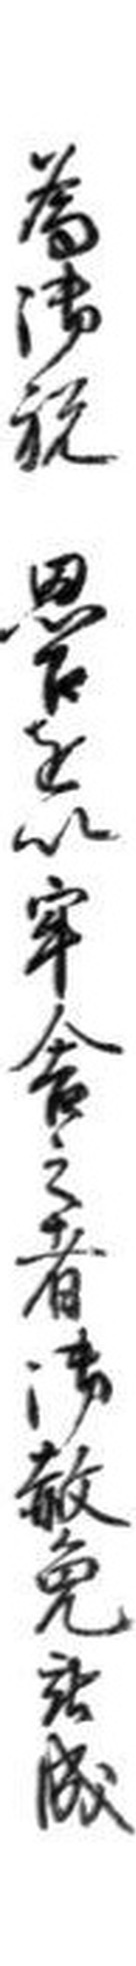為御祝思召を以牢舎之者御赦免被成
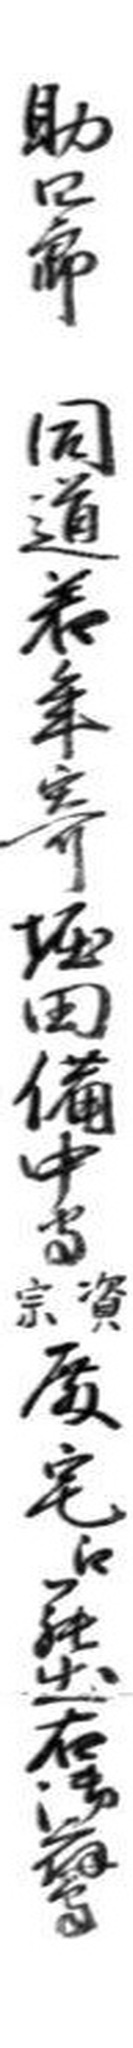助四郎同道若年寄堀田備中守資宗殿宅江罷出右御鷹
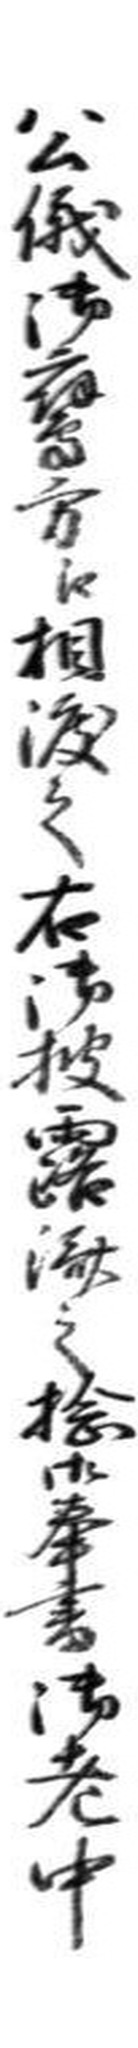公儀御鷹方江相渡之右御披露済之捻御奉書御老中
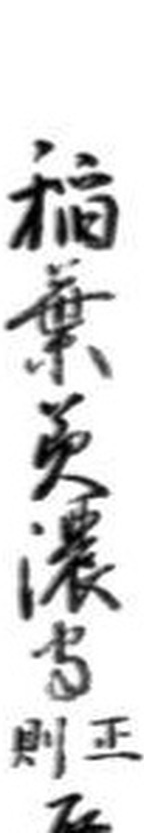稲葉美濃守
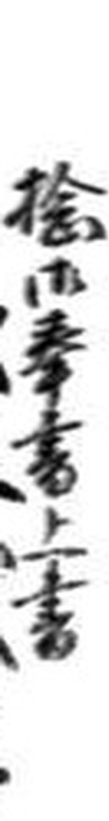捻御奉書上書
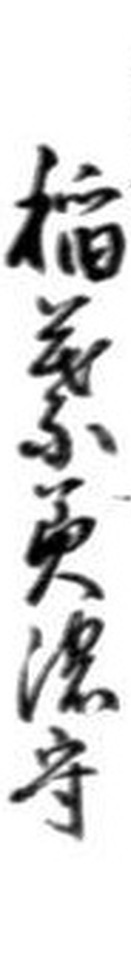稲葉美濃守
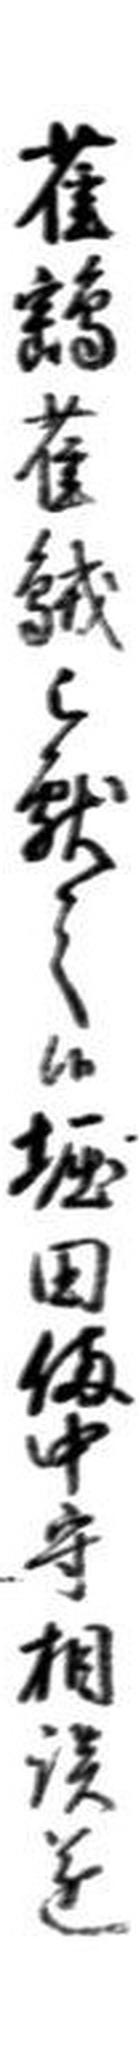雀鷂雀𪀚被献之候堀田備中守相談遂
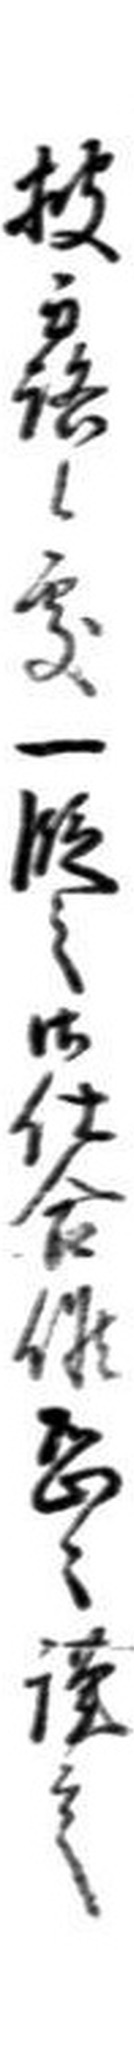披露候処一段之御仕合候恐々謹言
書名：家譜 八 光通公 従寛文十年到同十二年
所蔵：福井県文書館 Fukui Prefectural Archives
